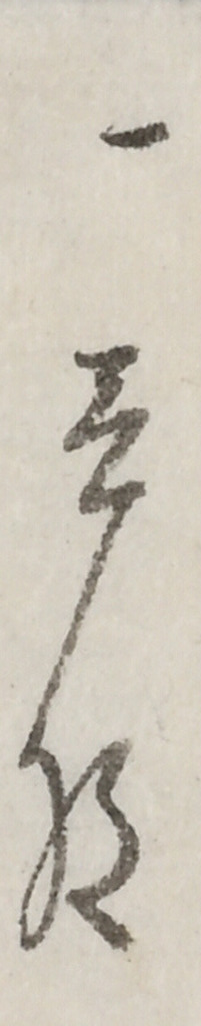一壱枚
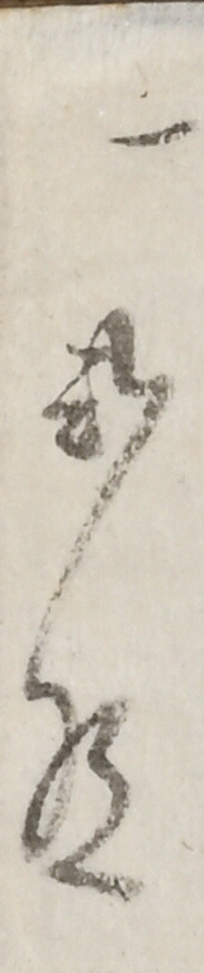一弐枚

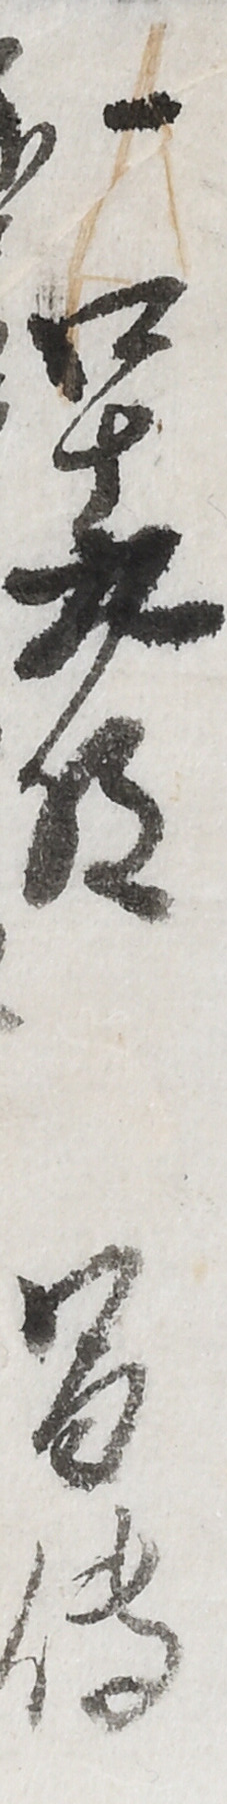一四十九枚富伝
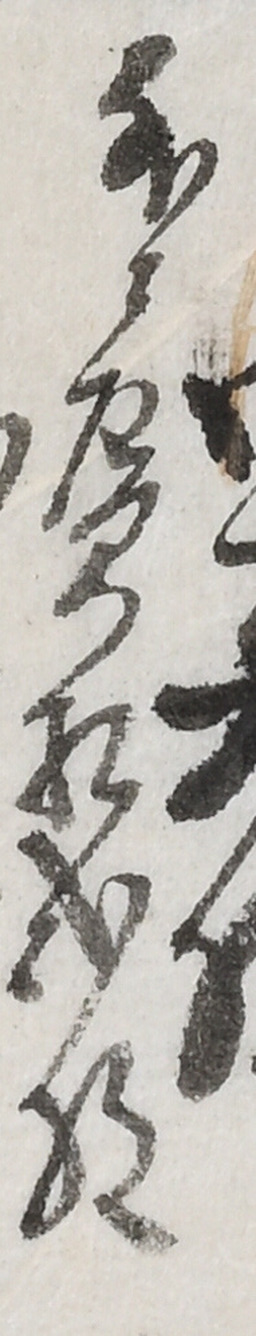外ニ贋札弐枚
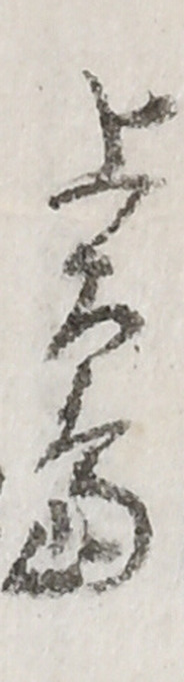上大島
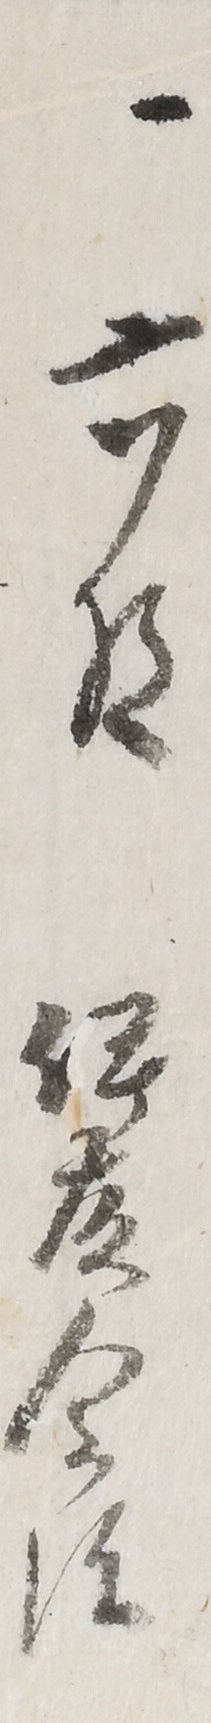一六枚伊藤金法
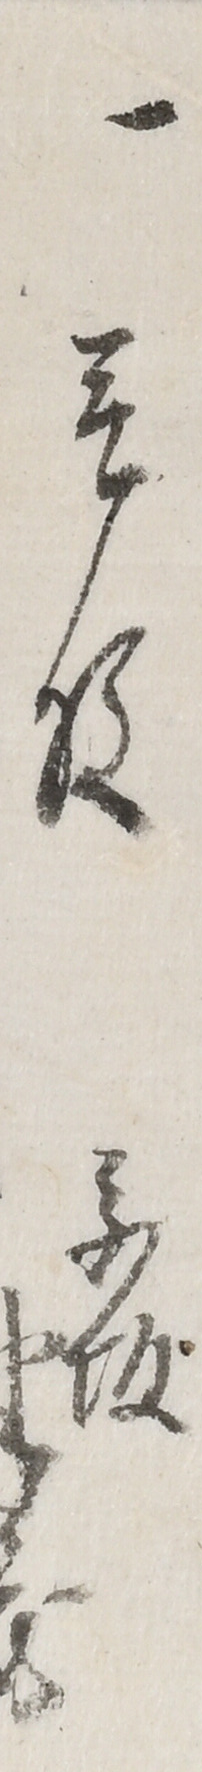一壱枚伝十

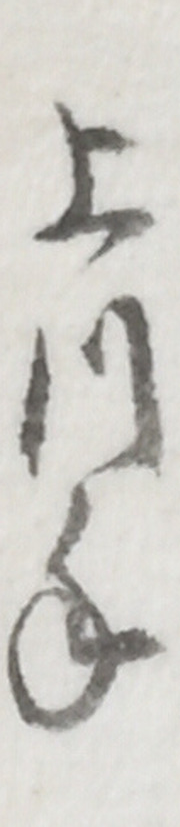上川手
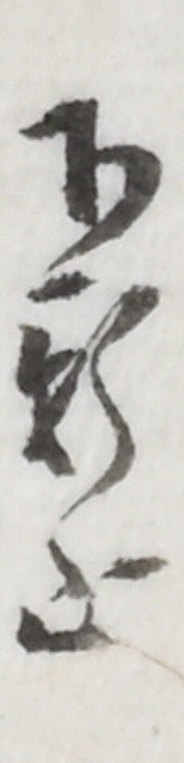下新山
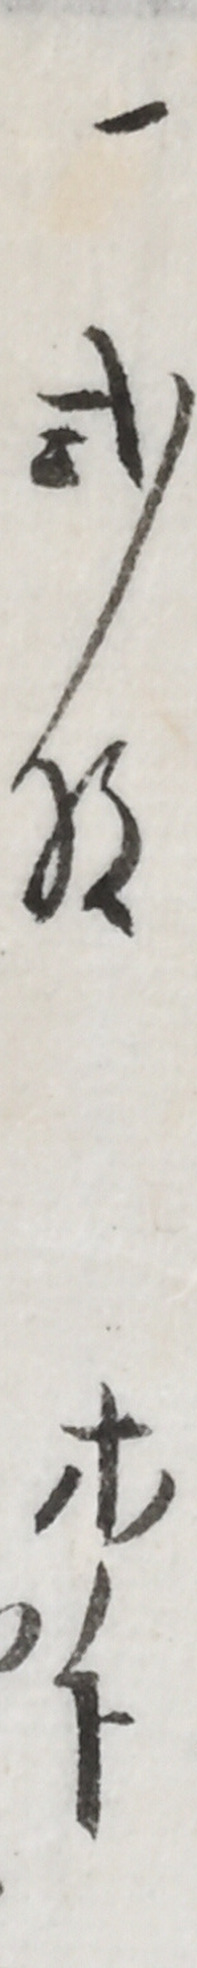一弐枚杉佐
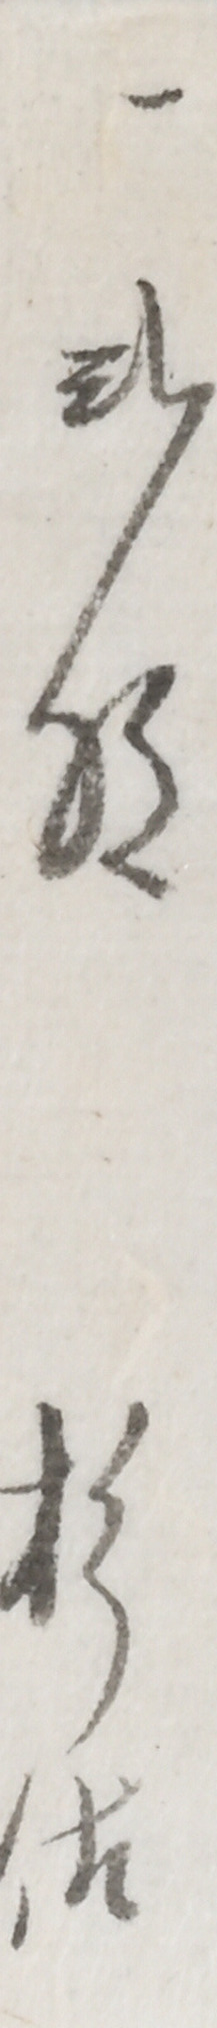一弐枚杉佐
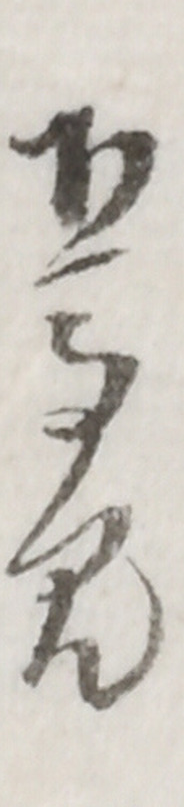下馬見
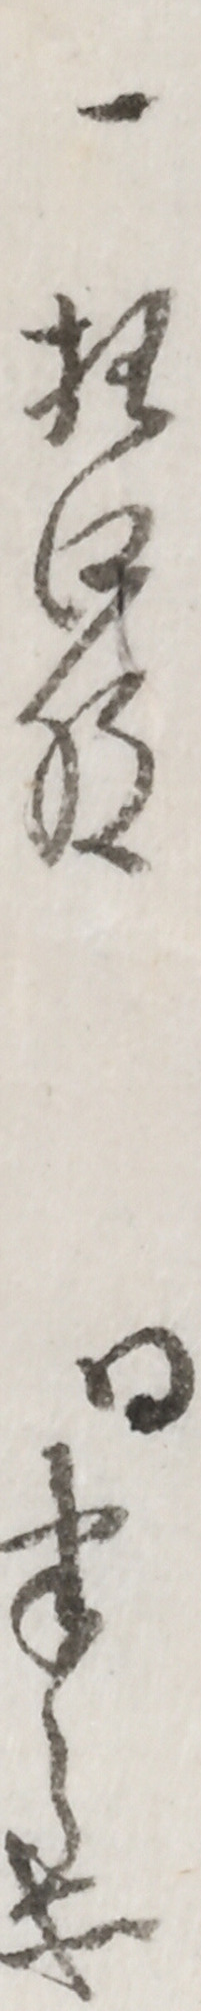一拾四枚半兵衛

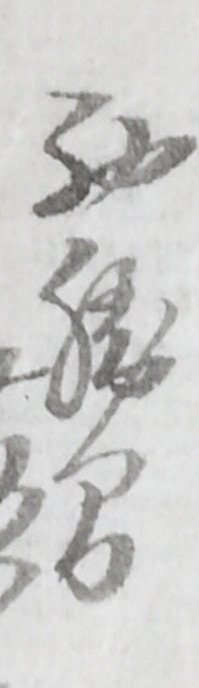西勝間
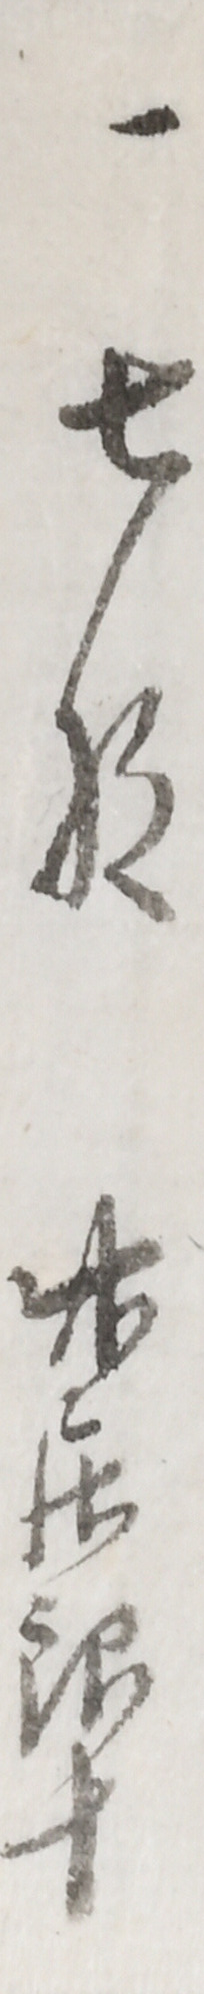一七枚竹居銀十
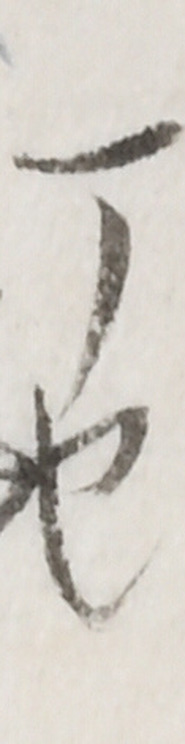一ノセ
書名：髙遠限楮幣引換覚帳
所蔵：伊那市立高遠町図書館・合同会社AMANE
